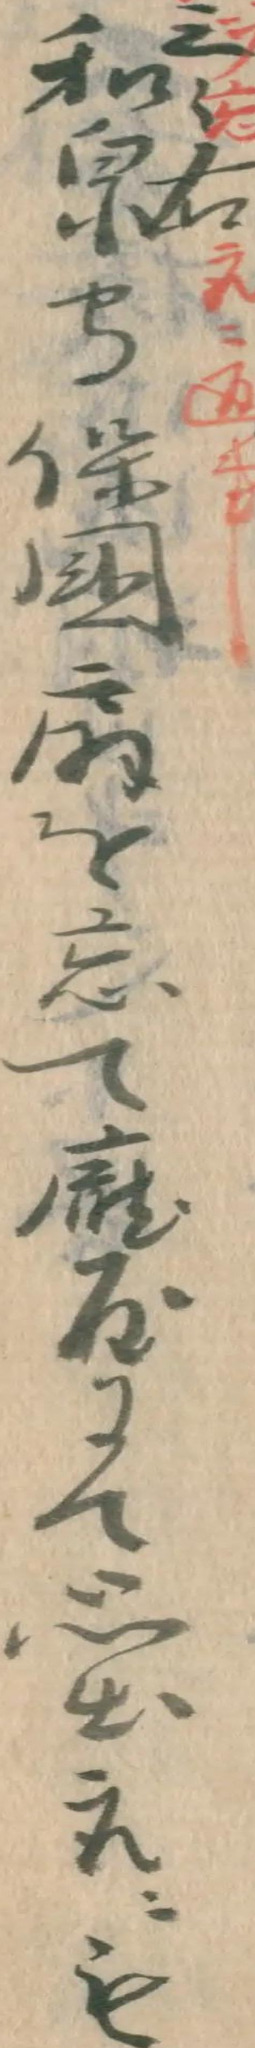和泉守保国扇を忘て厩屋にて思出取ニも
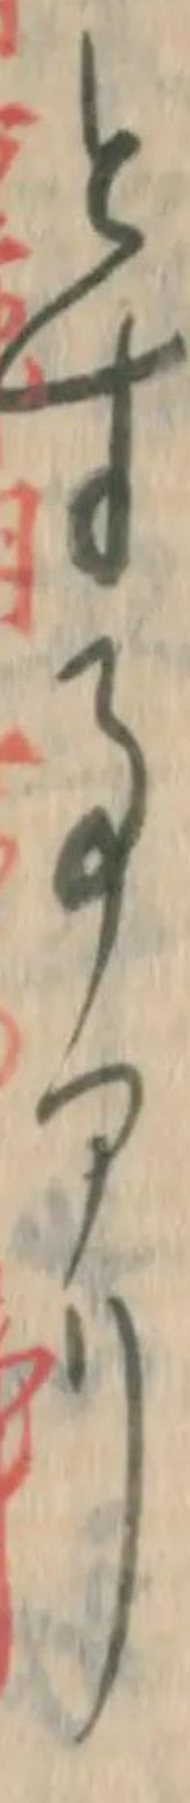とす事アリ
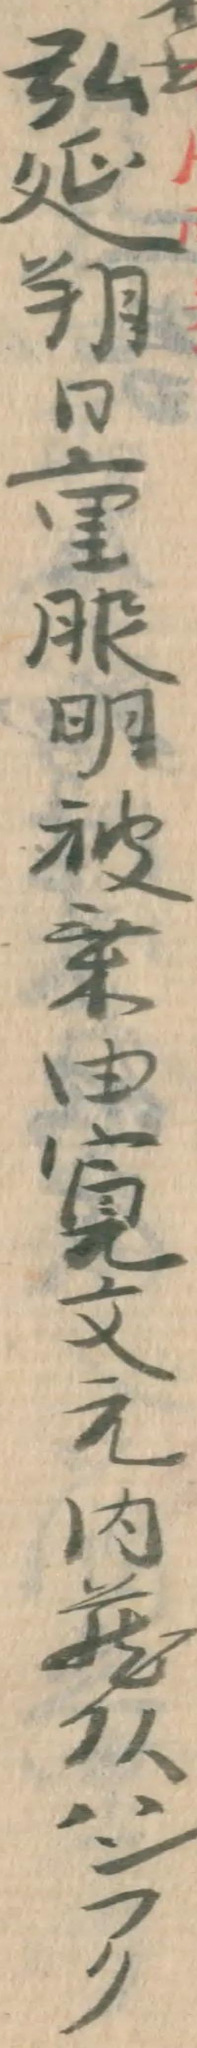弘延朔日重服明被乗由寛文元内蔵頭ハンフク
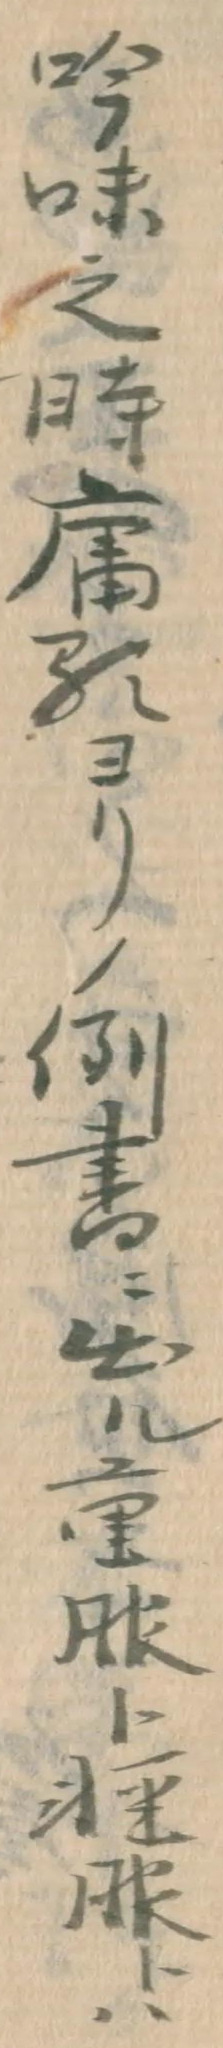吟味之時庸類ヨリノ例書ニ出ル重服ト軽服トハ
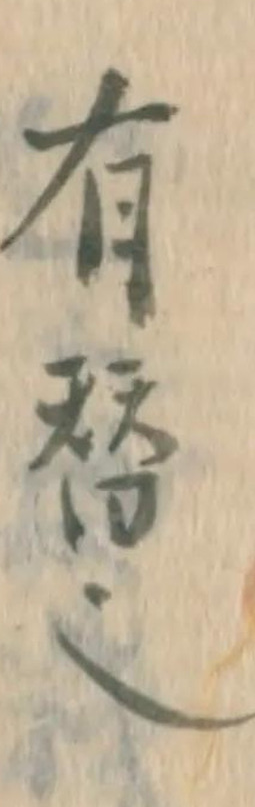有替也
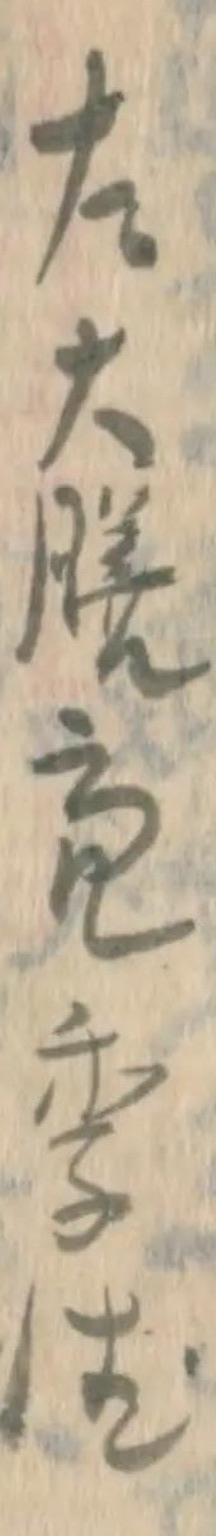左大膳亮季徳
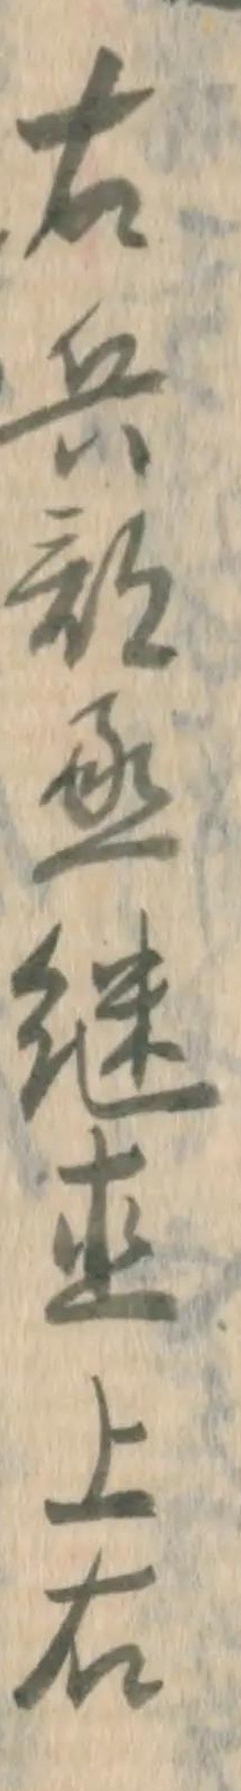右兵部丞継直上右
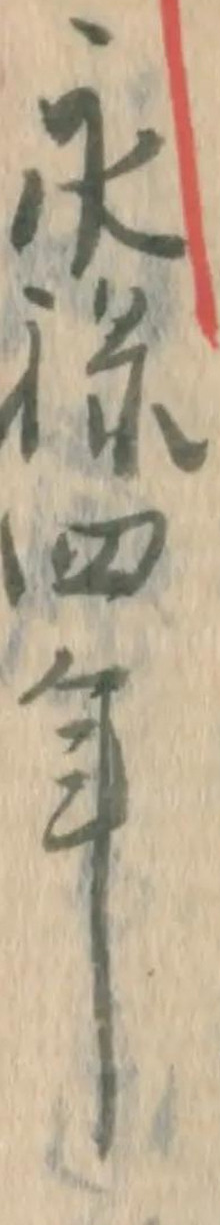永禄四年
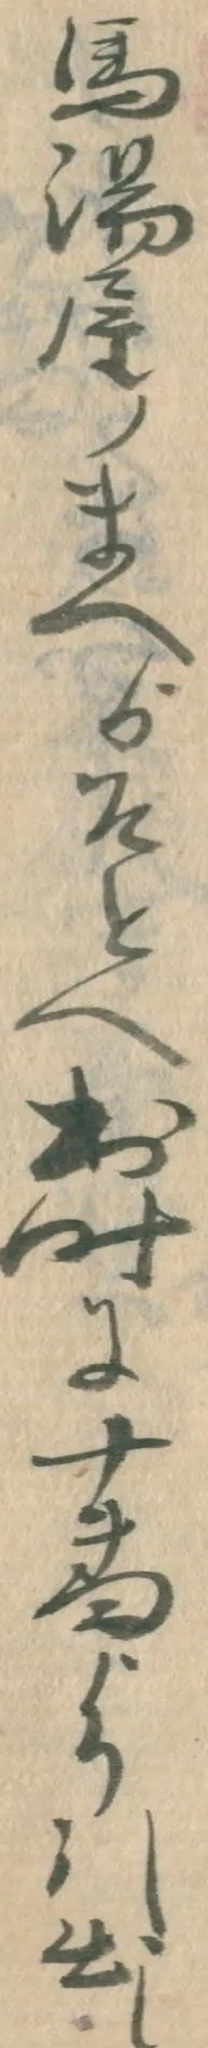馬湯屋ノまへゟそとへ出時に十番より引出し
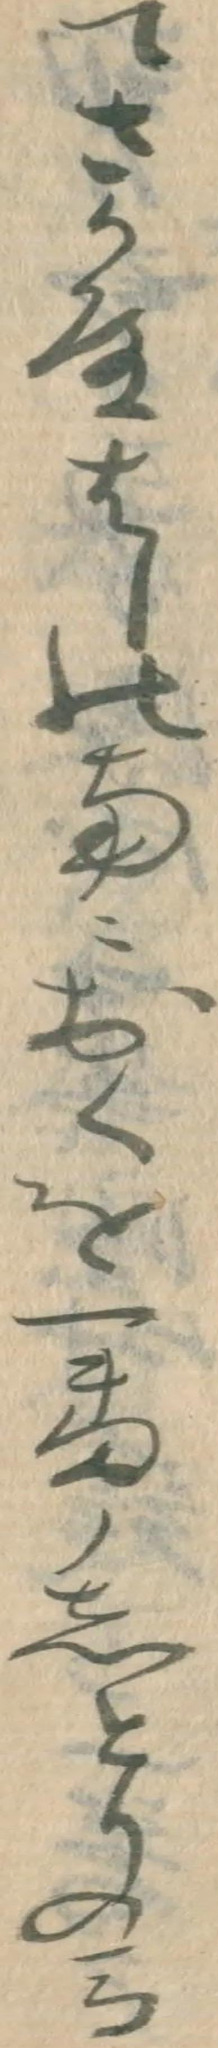てさか殿はしの南ニおくを一番ノしとりの馬
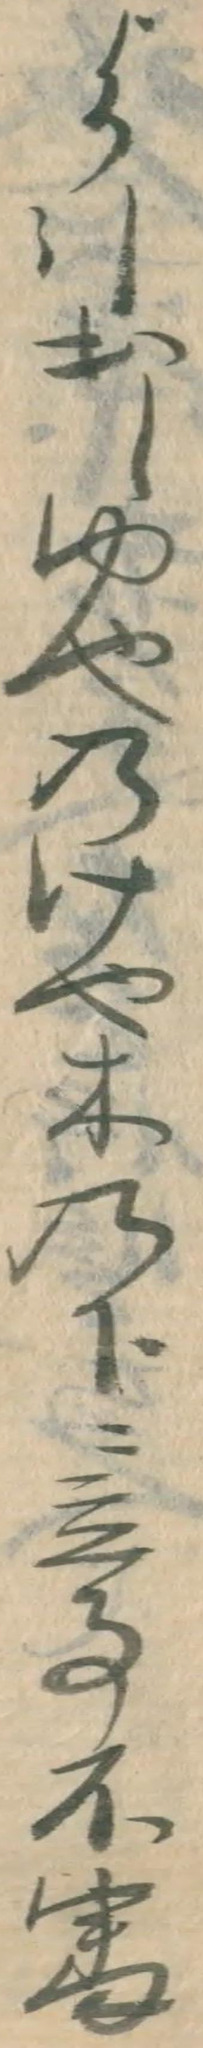より引出しゆやのけや木の下ニ立事不審

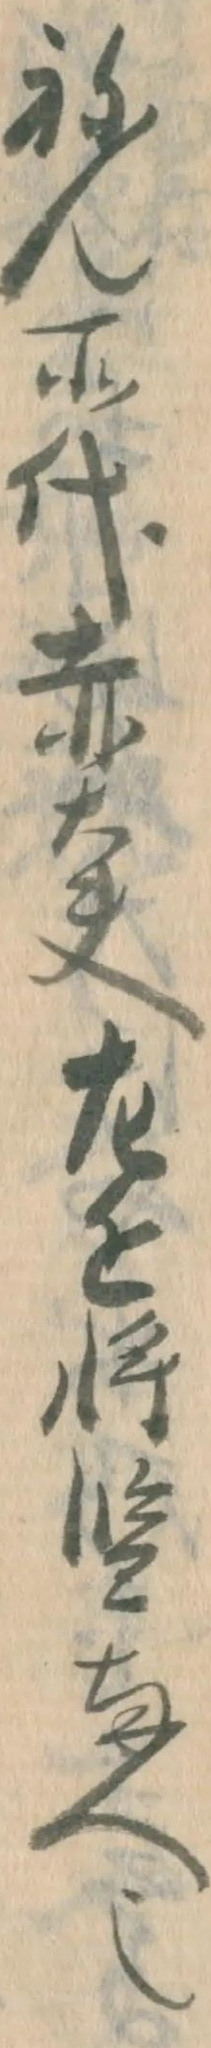ねん所代赤大夫左近将監両人也
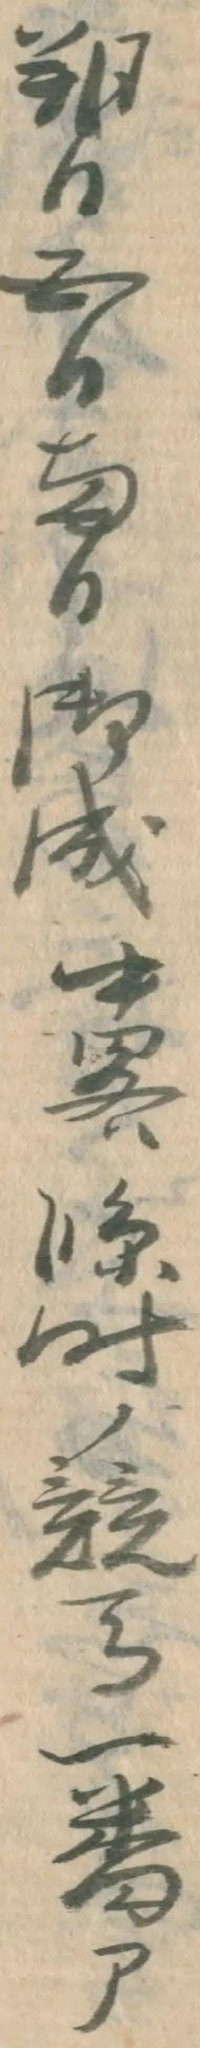朔日五日両日御成中略臨時ノ競馬一番ア
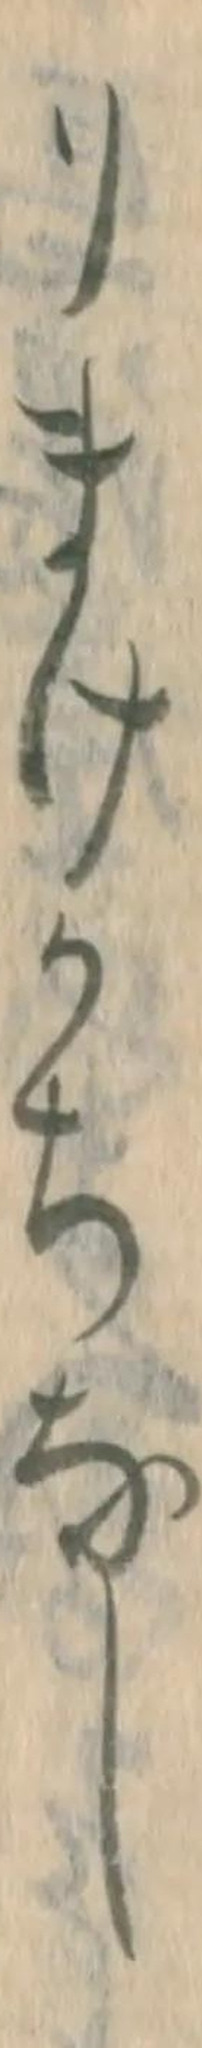りまけかちなし
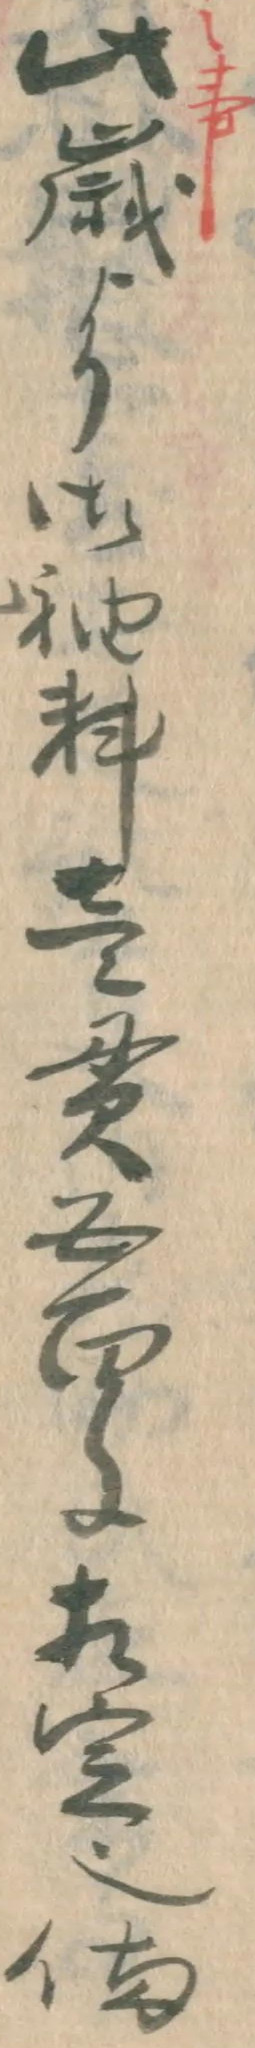此歳より御袖料壱貫五百文相定也備
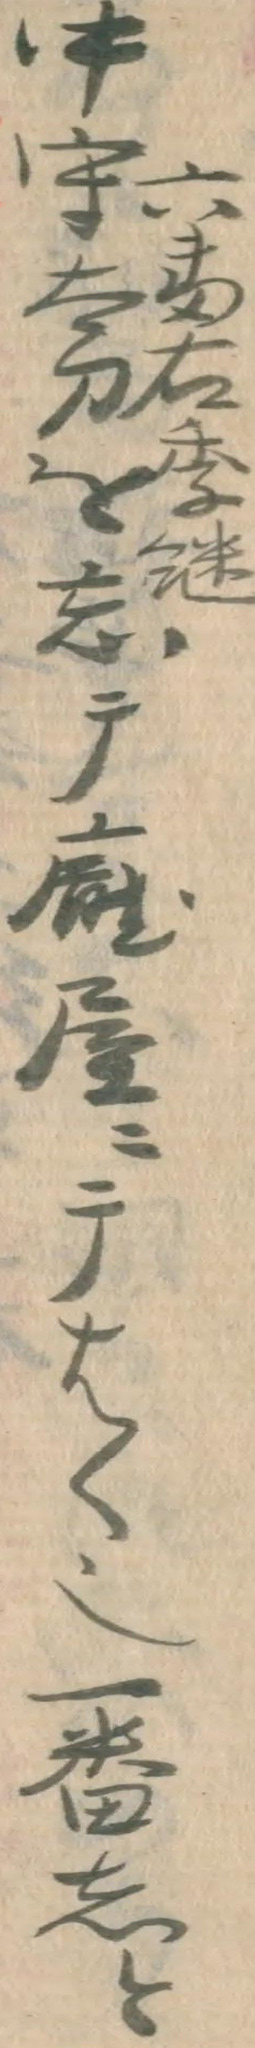中守太刀を忘テ厩屋ニテはく也一番しと
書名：賀茂社記録. 第10冊
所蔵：国立国会図書館 National Diet Library, JAPAN
